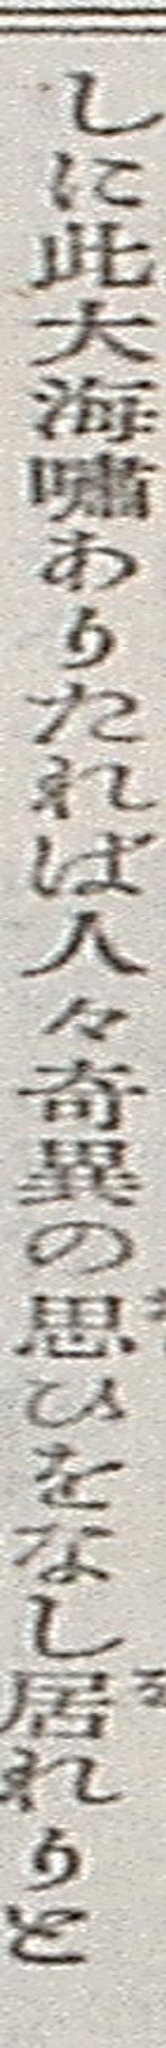しに此大海嘯ありたれば人々奇異の思ひをなし居れりと
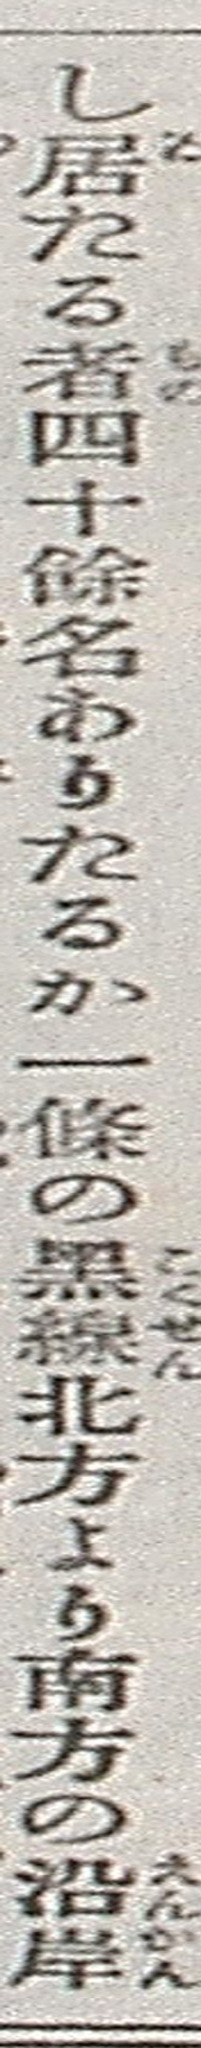し居たる者四十余名ありたるか一条の黒線北方より南方の沿岸
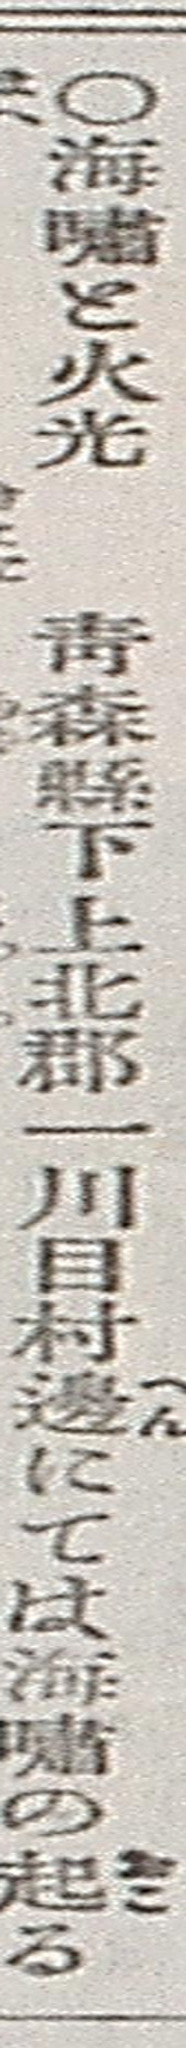○海嘯と火光青森県下上北郡一川目村辺にては海嘯の起る
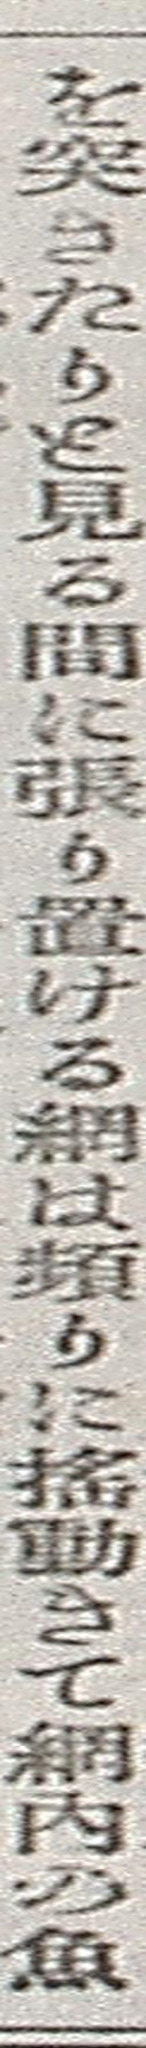を突きたりと見る間に張り置ける網は頻りに揺動きて網内の魚
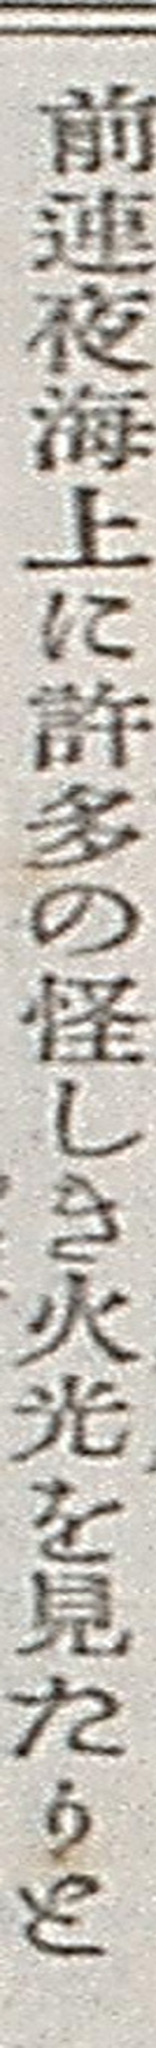前連夜海上に許多の怪しき火光を見たりと
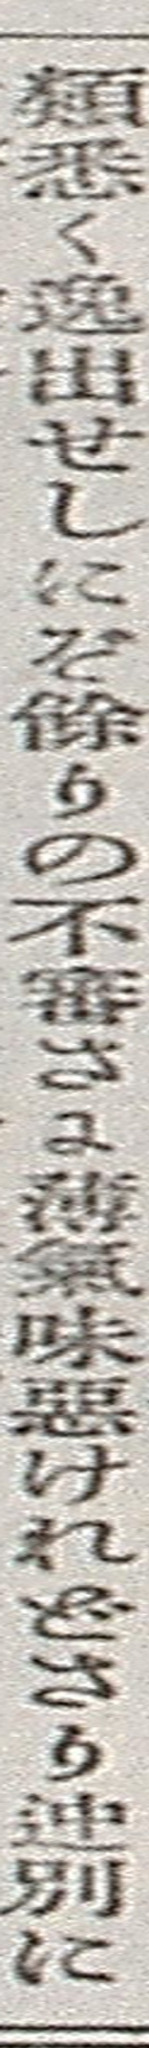類悉く逸出せしにぞ余りの不審さに薄気味悪けれどさり迚別に
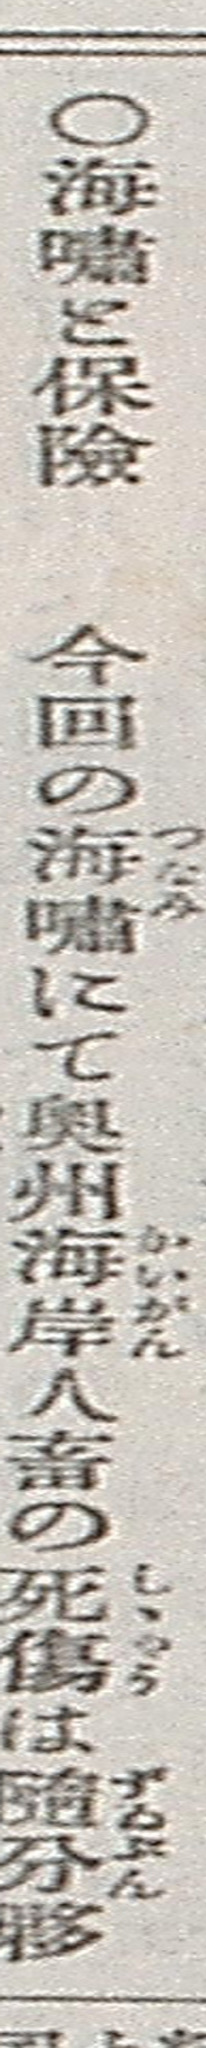○海嘯と保険今回の海嘯にて奥州海岸人畜の死傷は随分夥
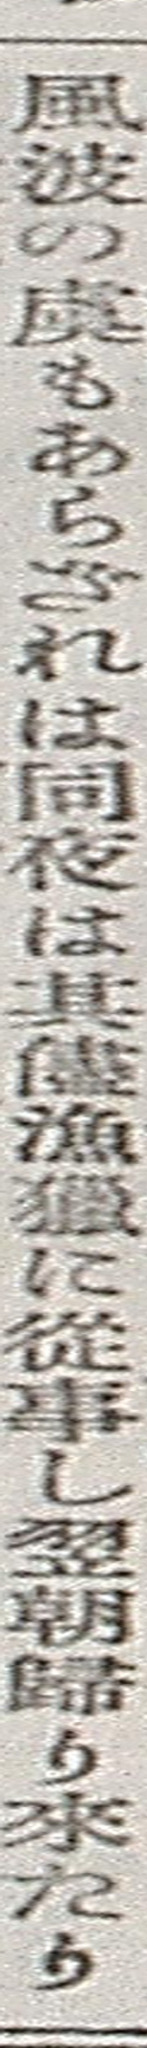風波の虞もあらざれは同夜は其侭漁猟に従事し翌朝帰り来たり
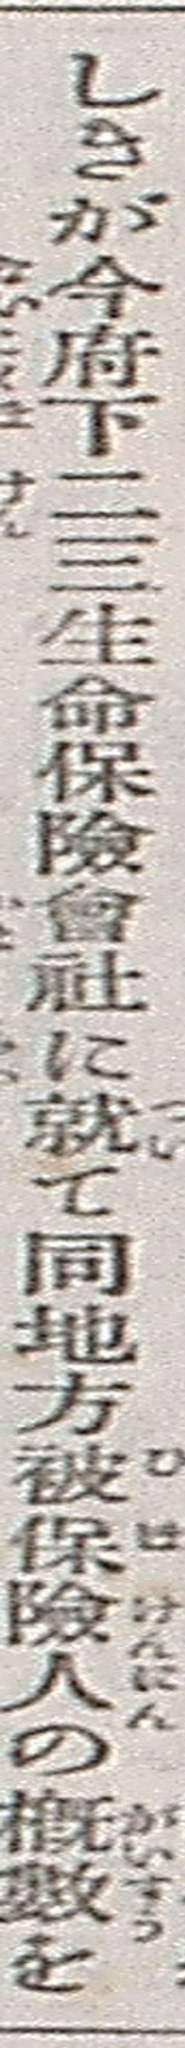しきが今府下二三生命保険会社に就て同地方被保険人の概数を
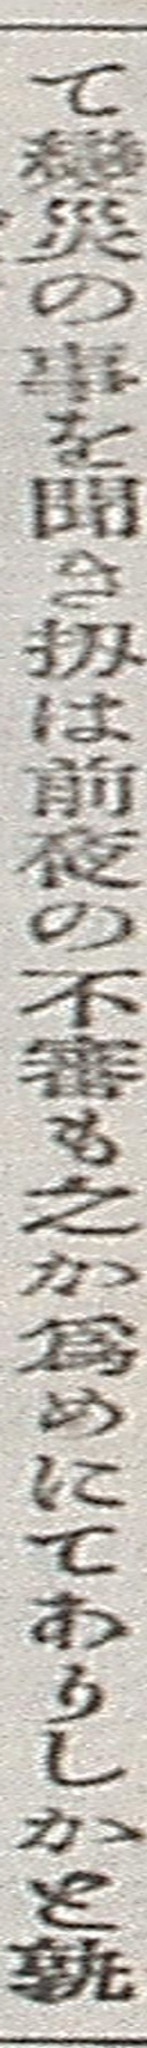て変災の事を聞き扨は前夜の不審も之か為めにてありしかと孰
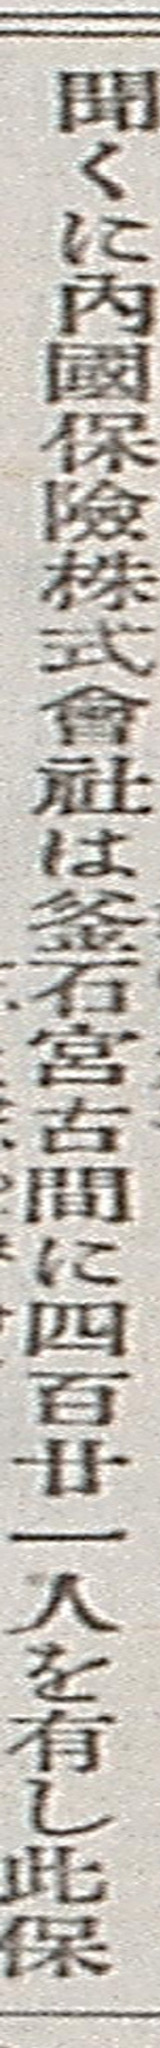聞くに内国保険株式会社は釜石宮古間に四百廿一人を有し此保
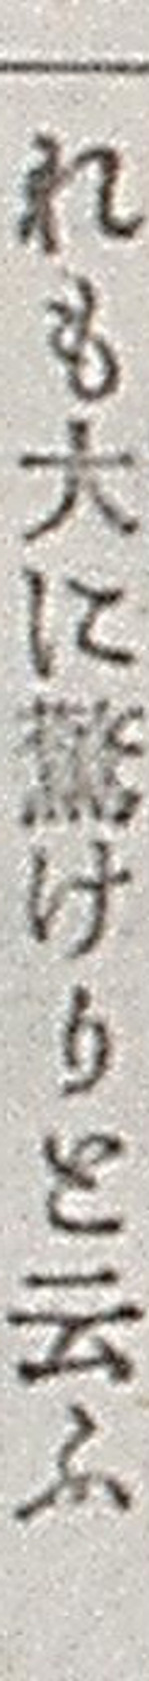れも大に驚けりと云ふ
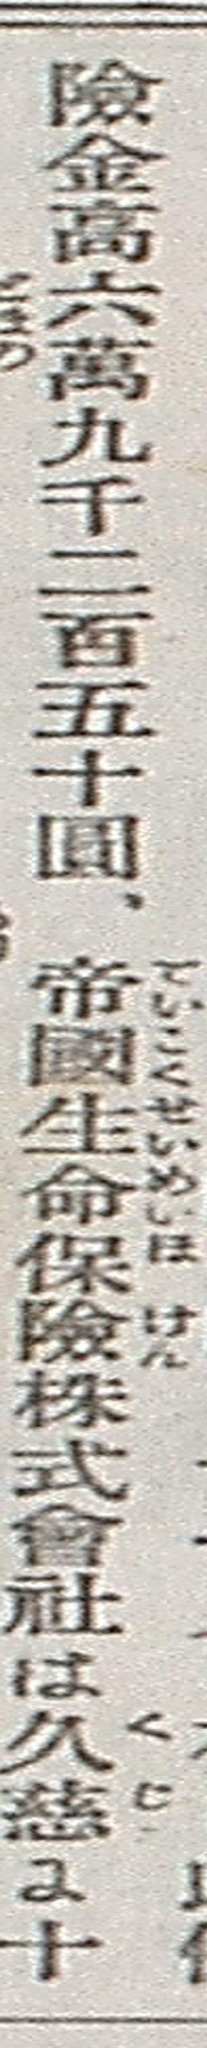険金高六万九千二百五十円、帝国生命保険株式会社は久慈に十
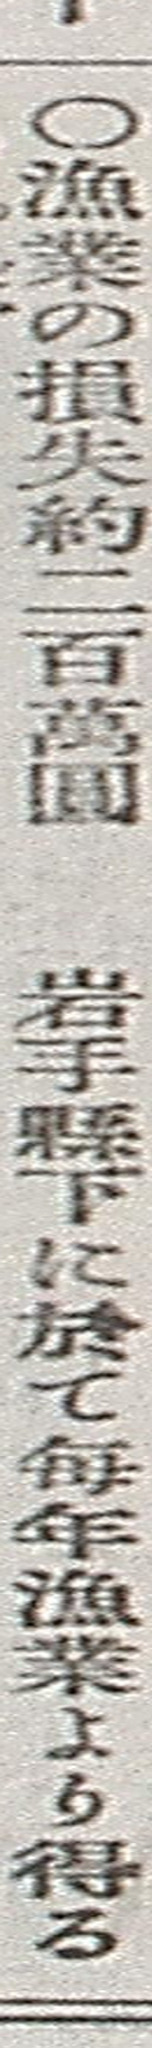○漁業の損失約二百万円岩手県下に於て毎年漁業より得る
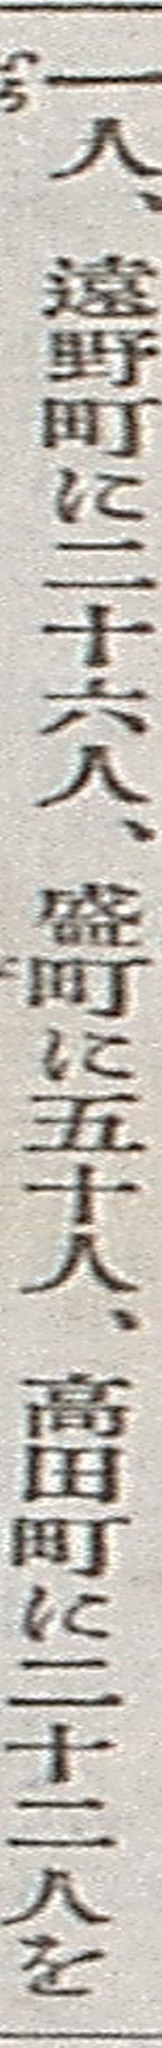一人、遠野町に二十六人、盛町に五十人、高田町に二十二人を
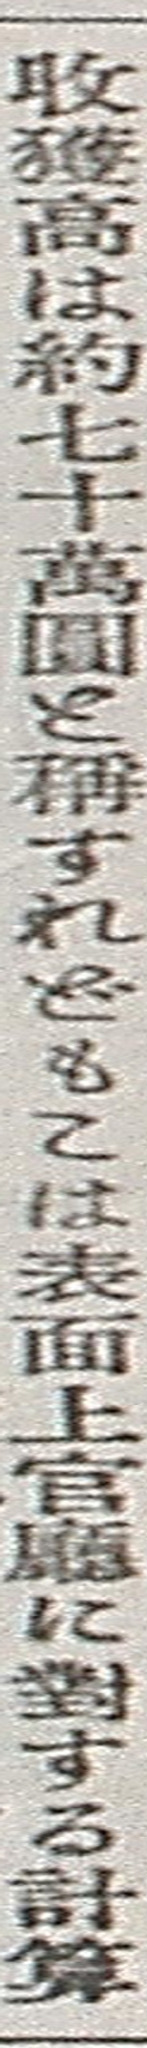収穫高は約七十万円と称すれどもこは表面上官庁に対する計算
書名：風俗畫報臨時増刊第百二十號　大海嘯被害録（下）
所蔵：東京大学地震研究所図書室 Earthquake Research Institute Library, The University of Tokyo, JAPAN
